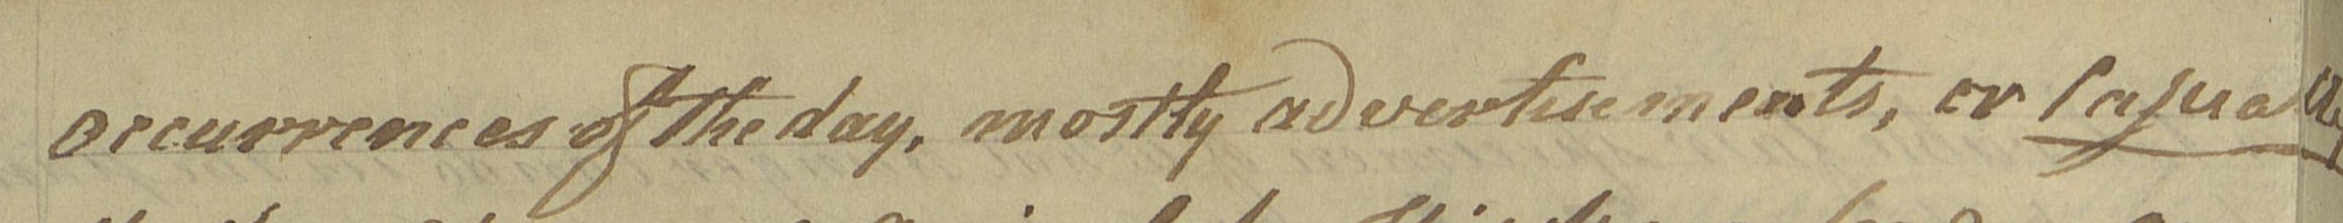occurrences of the day, mostly advertisements, or Casually
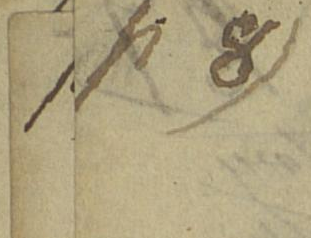p 8
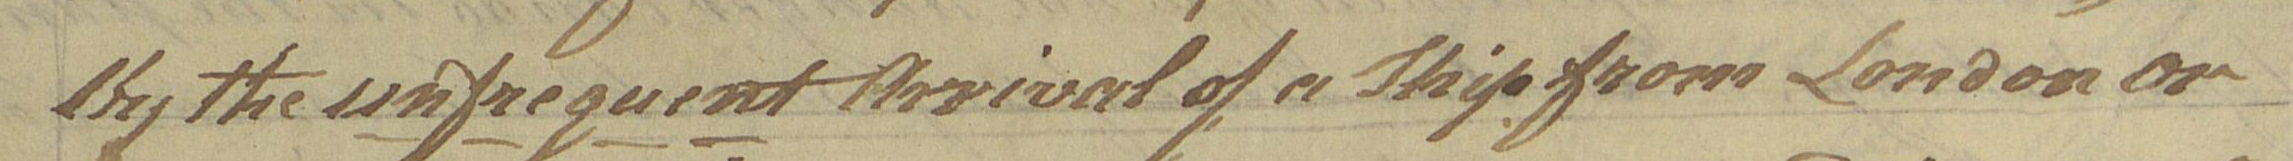by the infrequent Arrival of a Ship from London or
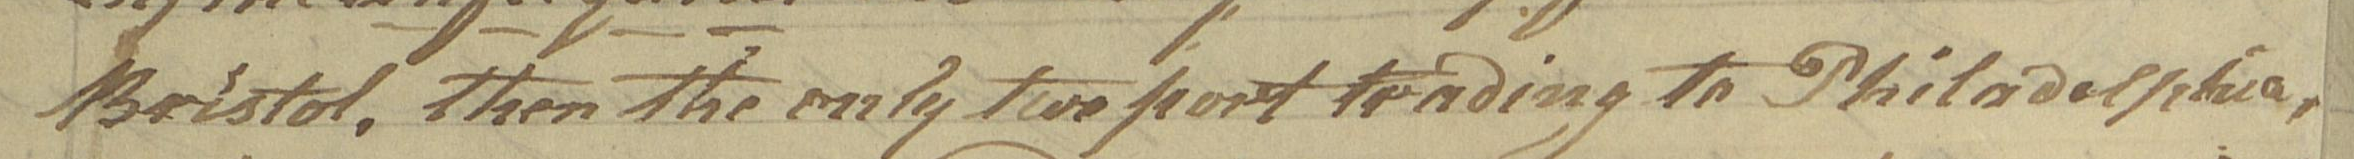Bristol, then the only two port trading to Philadelphia,
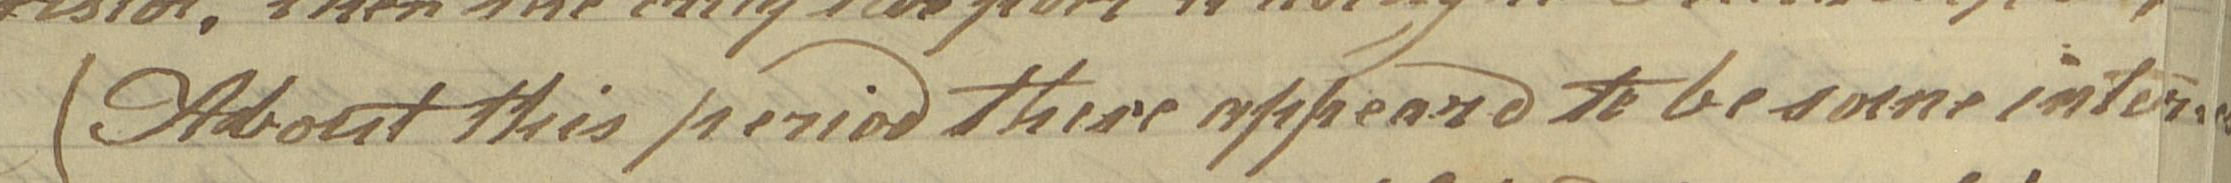(About this period there appeared to be some inter-
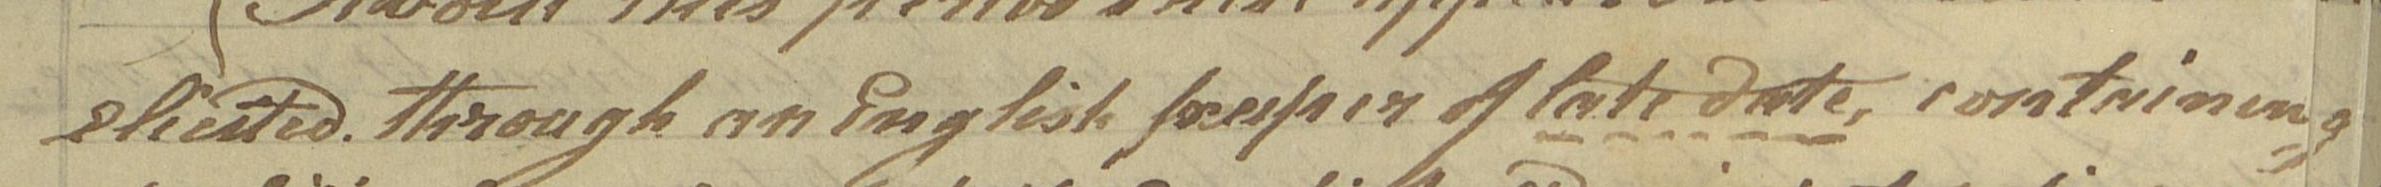elicited. through an English fresper of late date, containing
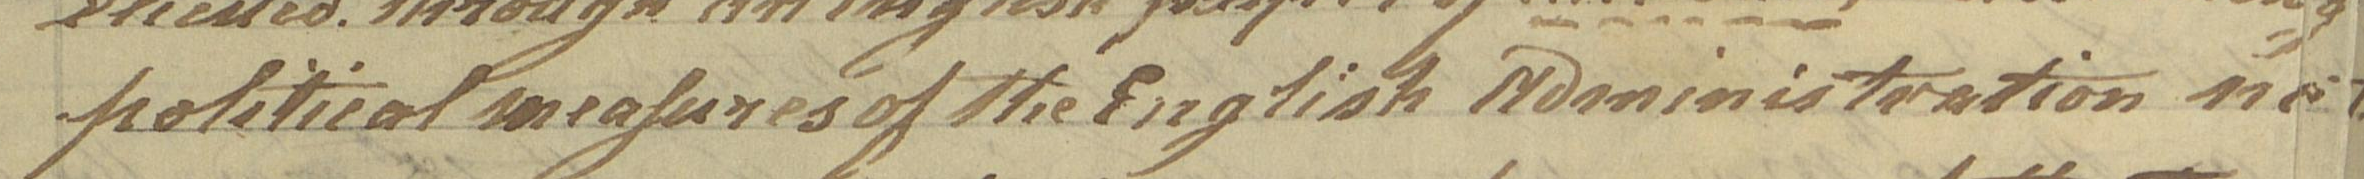political measures of the English Administration not
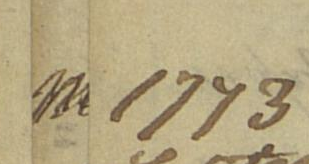1773
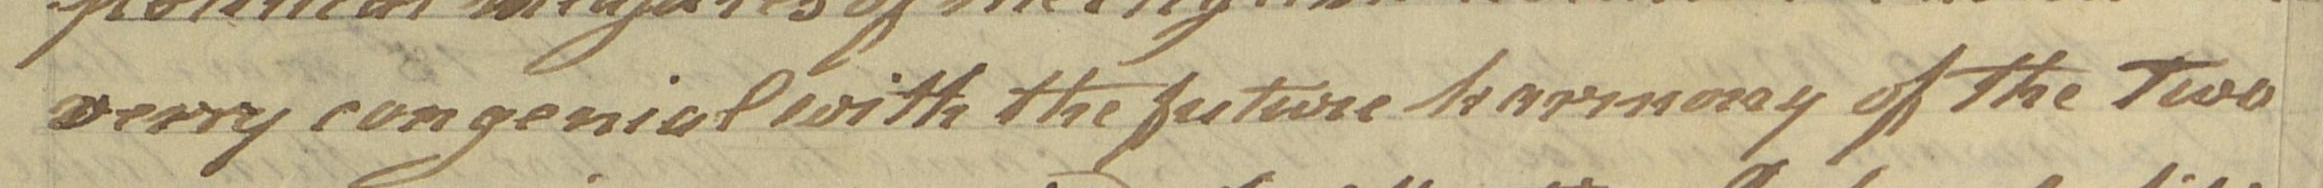very congenial with the future harmony of the two
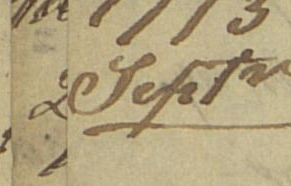Sept^r.
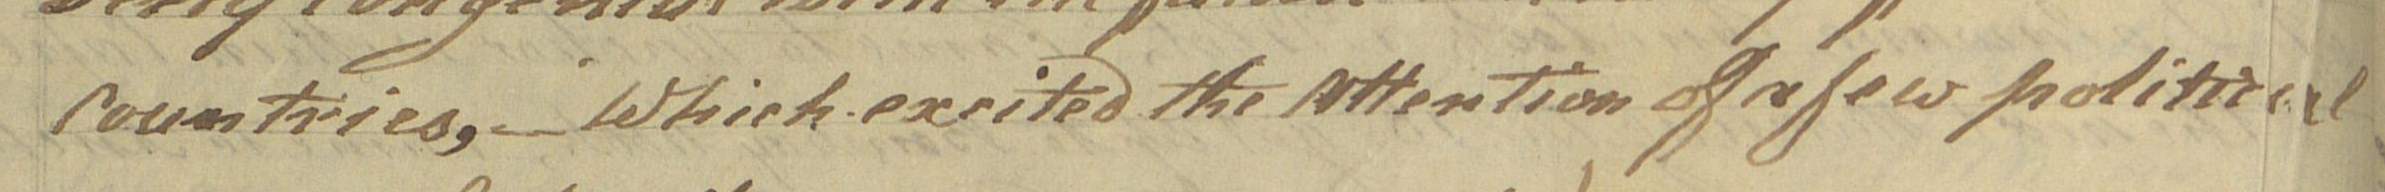countries, Which excited the Attention of a few political
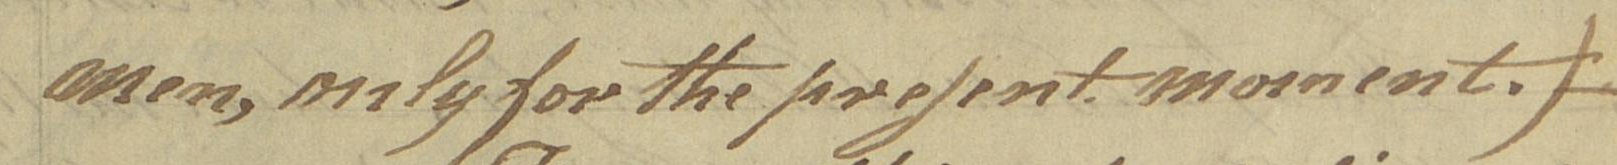men, only for the present moment.)
